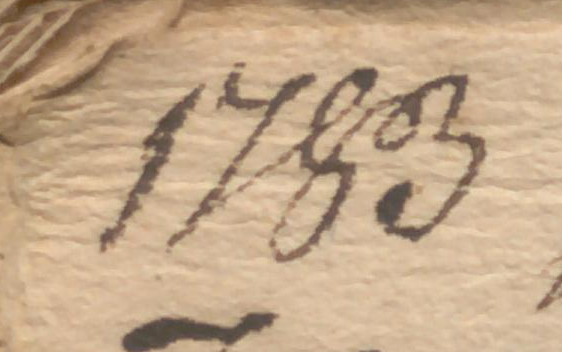1783
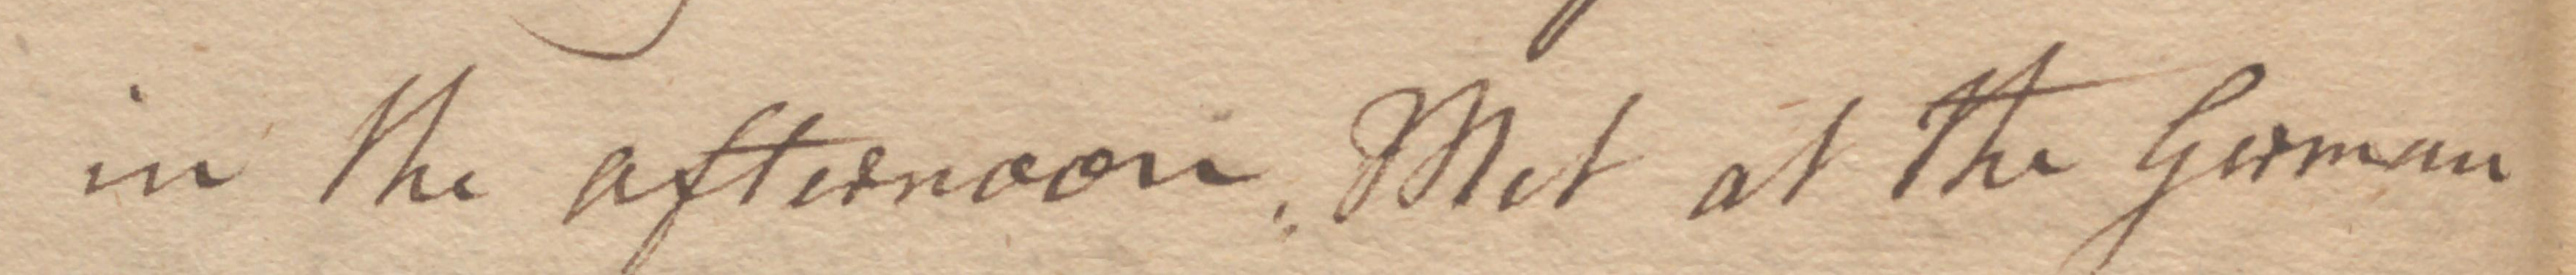in the afternoon Met at the German
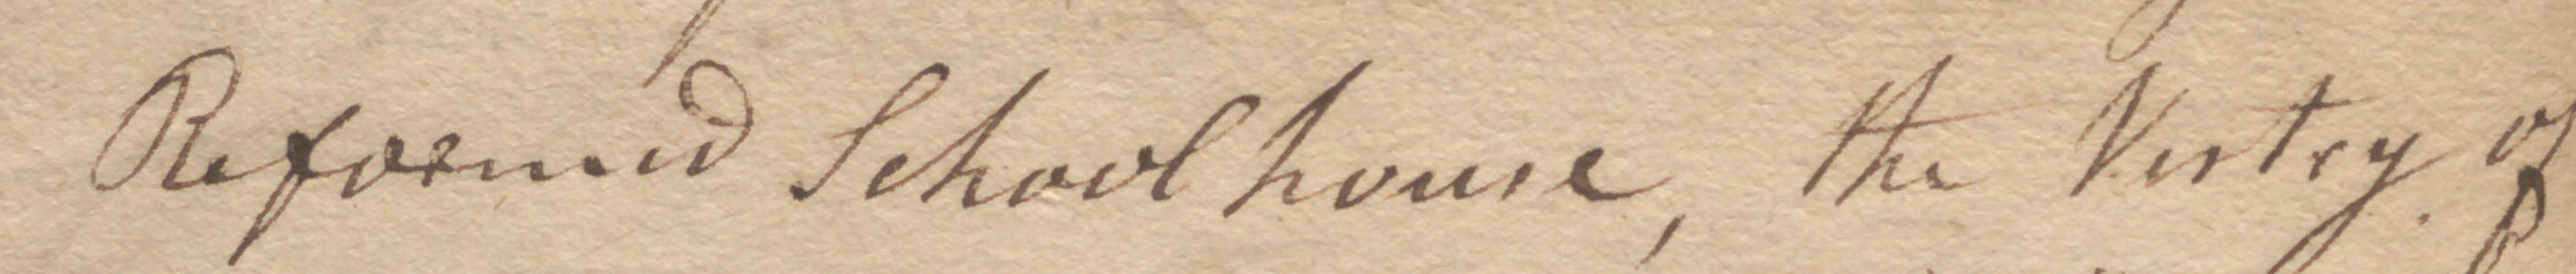Reformed School house the Vestry of
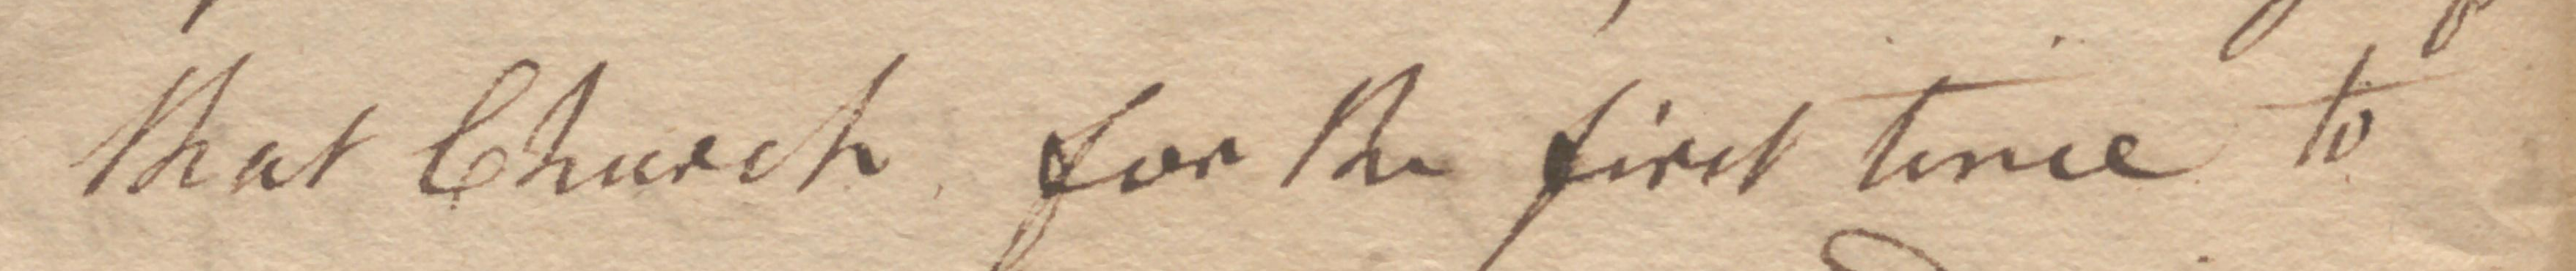that Church for the firet time to
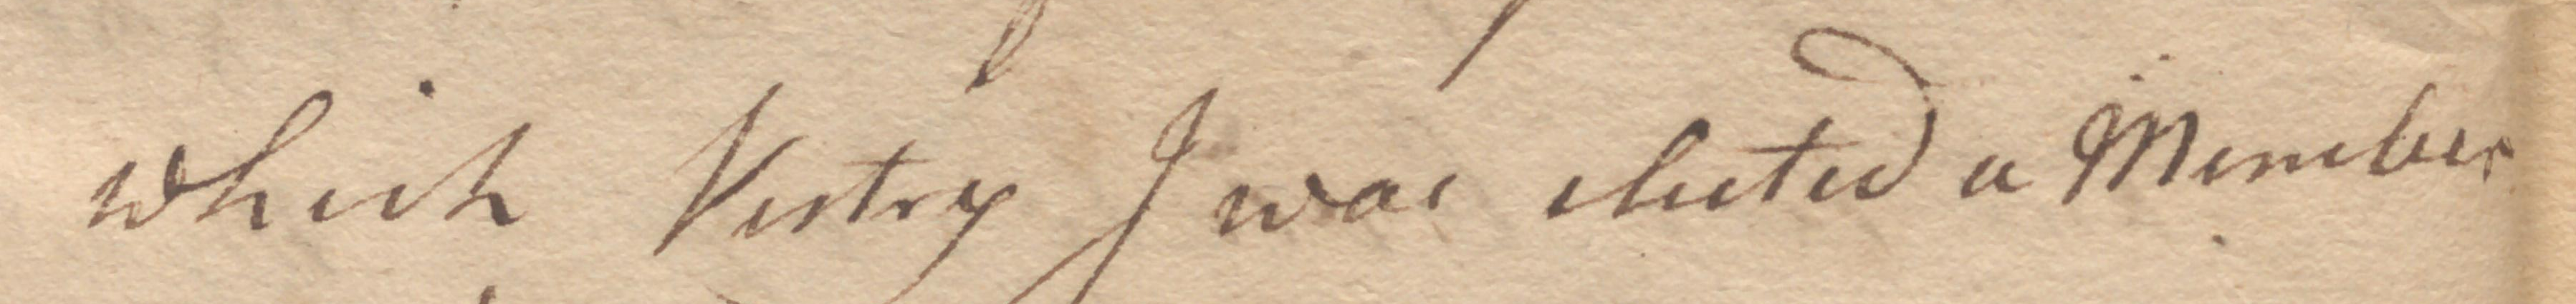which Vestry I was elected a Member
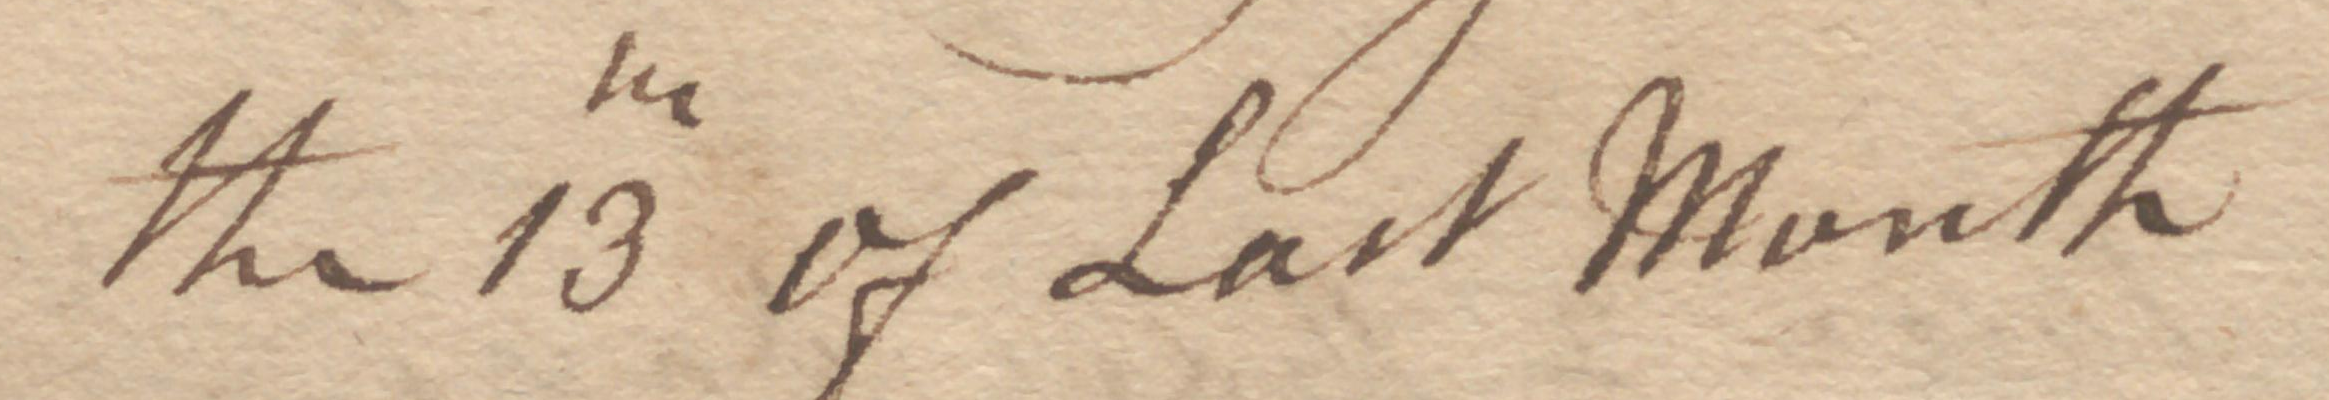the 13^th of Last Month
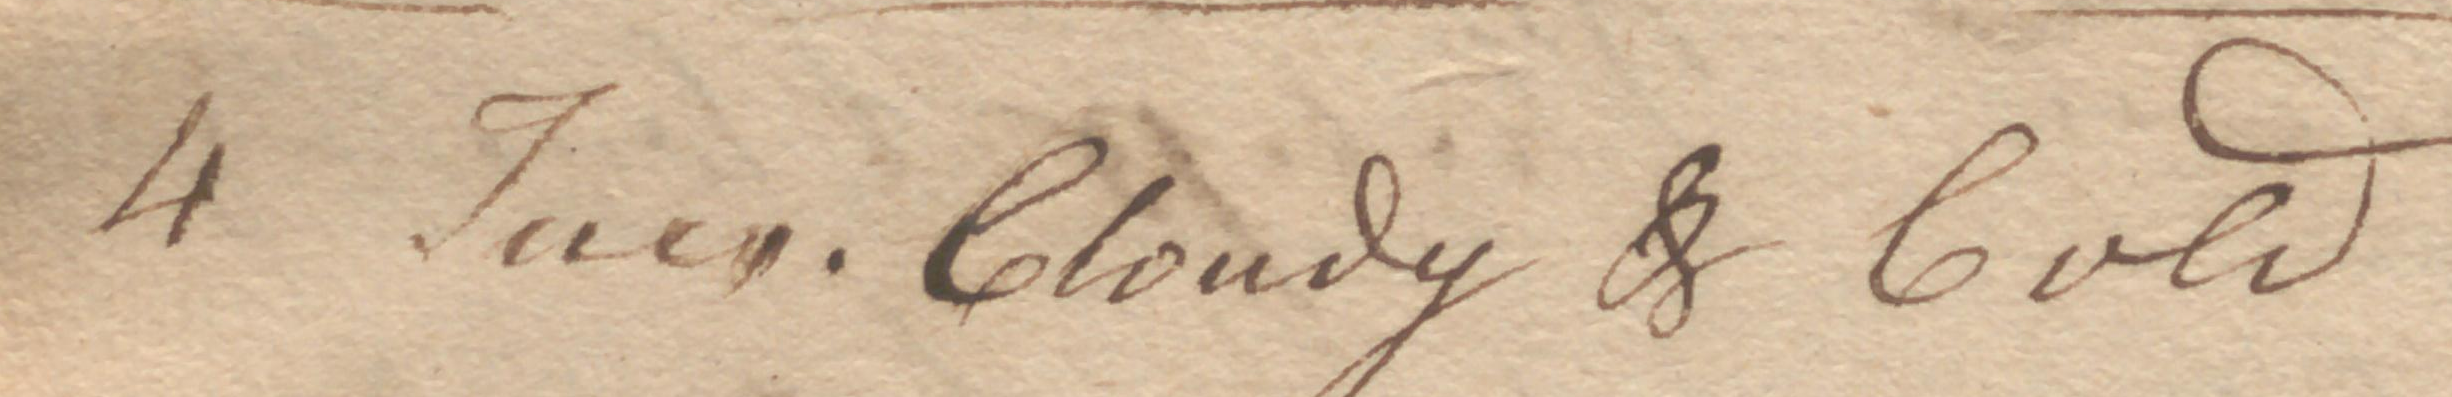4 Tues. Cloudy, & Cold
